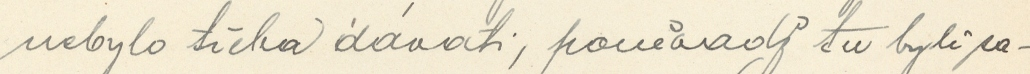nebylo třeba dávati, poněvadž tu byli sa-
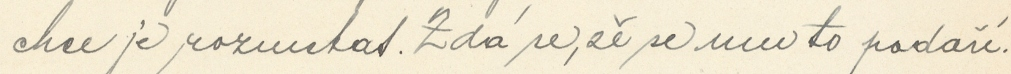chce je rozmetat. Zdá se, že se mu to podaří.
